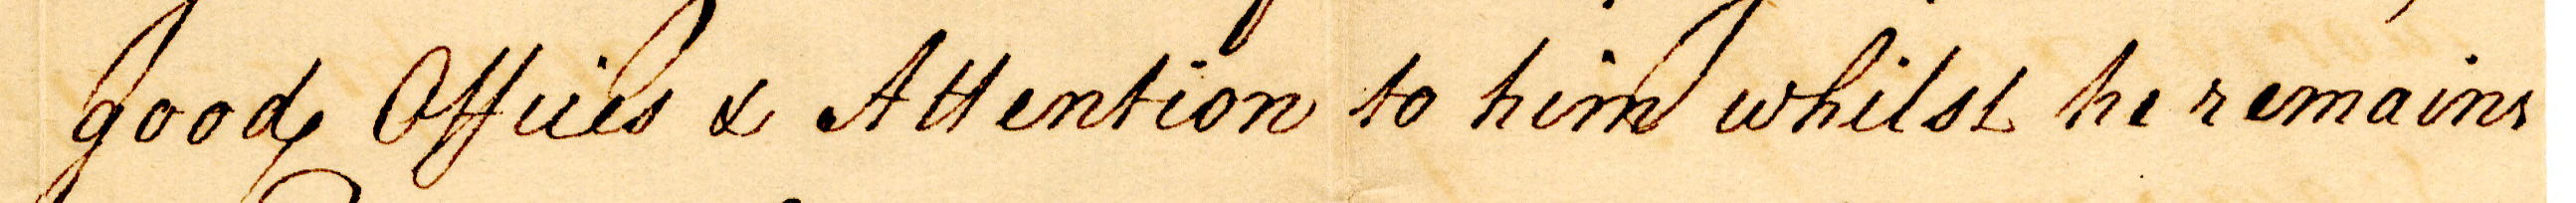good Offices & Attention to him whilst he remains
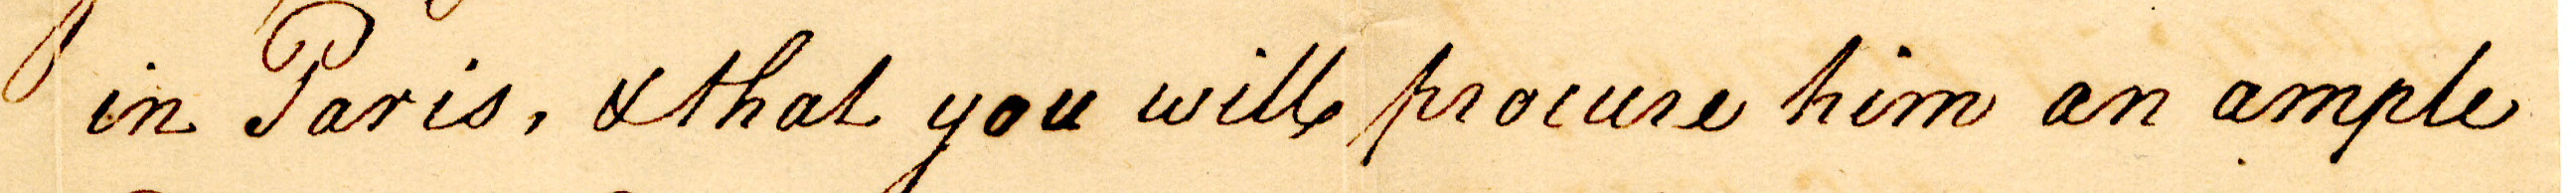in Paris, & that you will procure him an ample
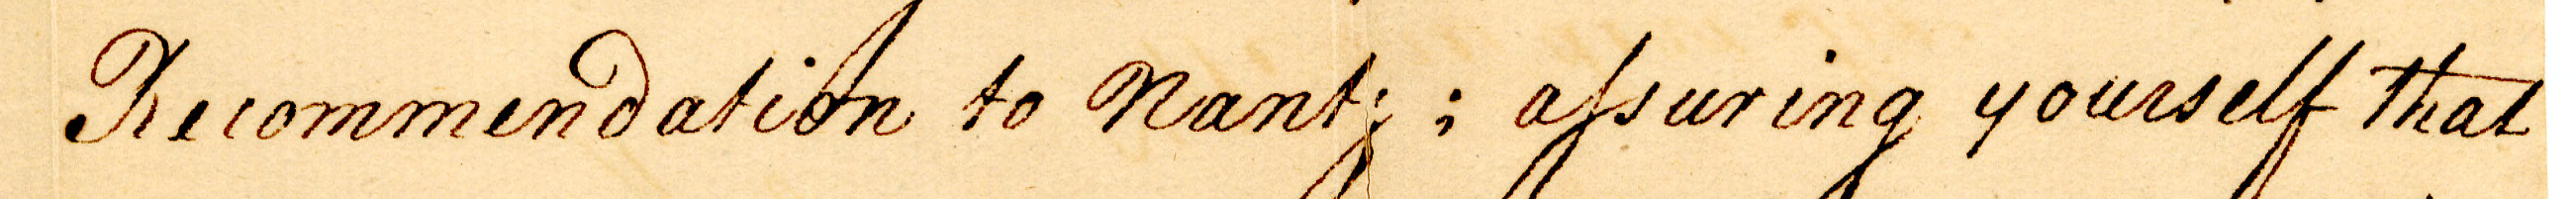Recommendation to Nantz; assuring yourself that
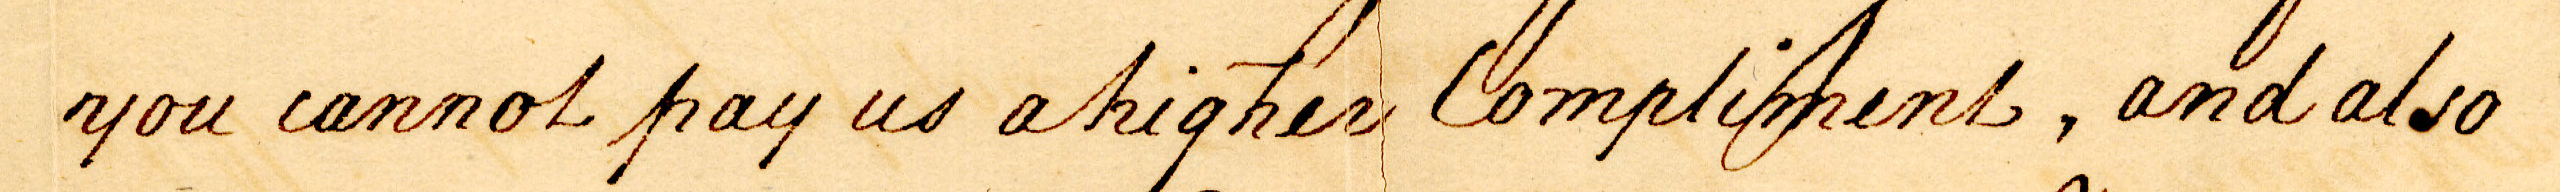you cannot pay us a higher Compliment, and also
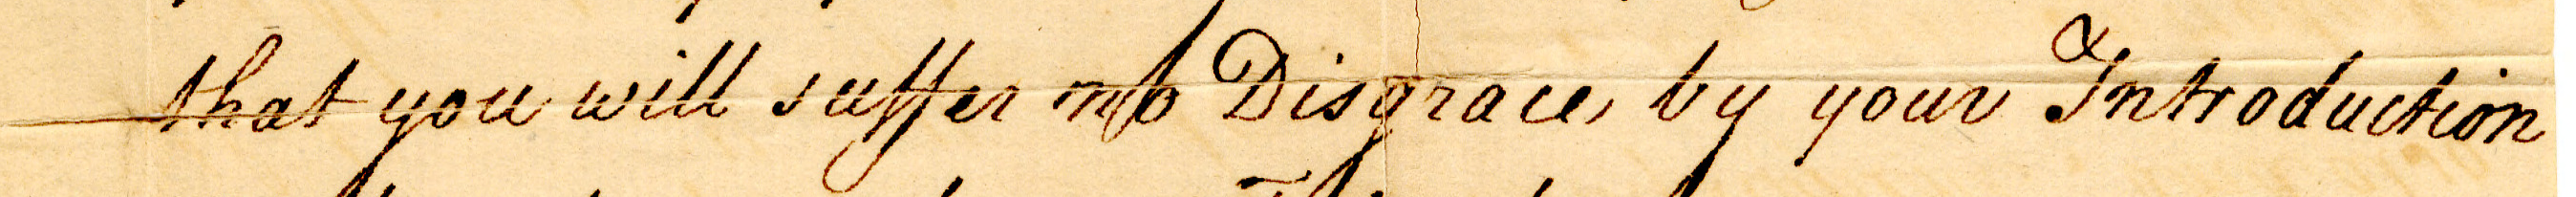that you will suffer no Disgrace by your Introduction
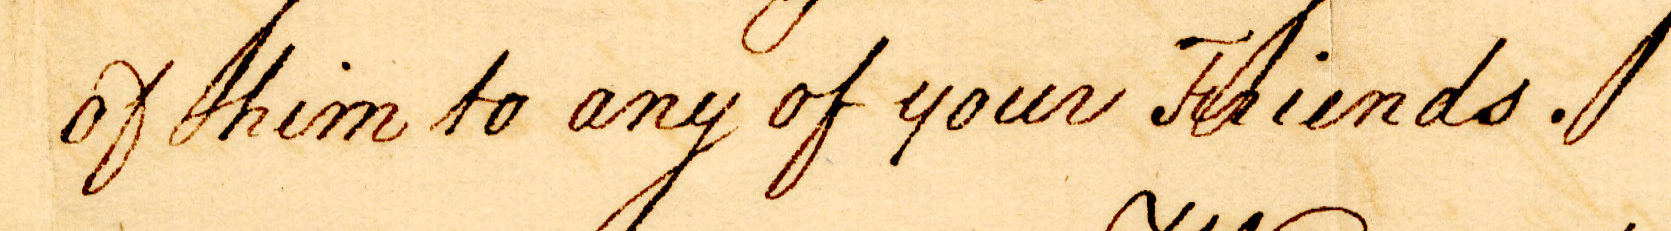of him to any of your Friends.
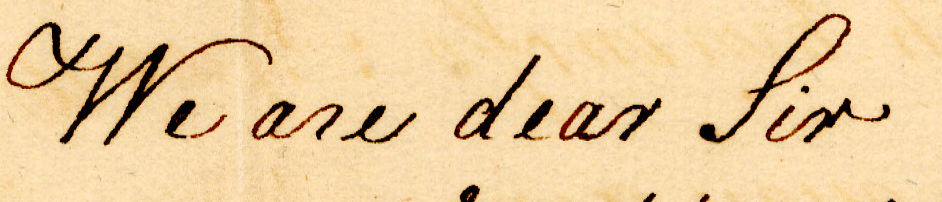We are dear Sir
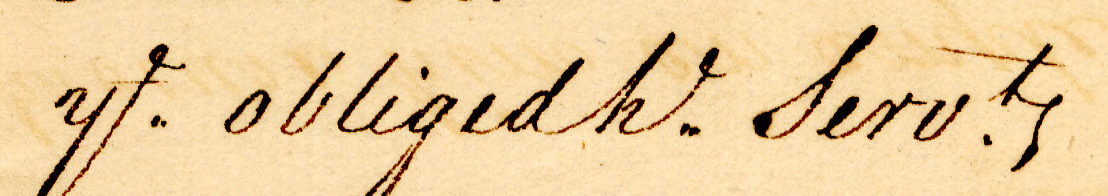y^r. obliged h^l. Serv^ts.
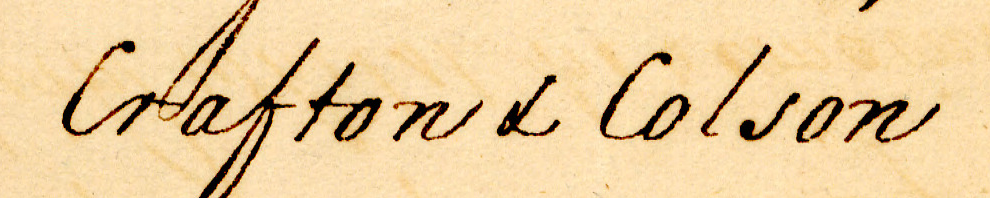Crafton & Colson
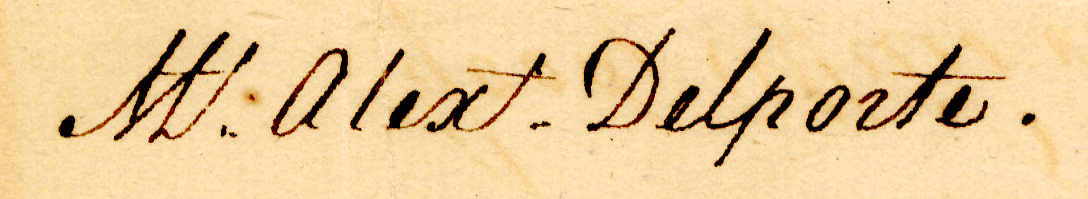M^r. Alex^r. Delporte.
